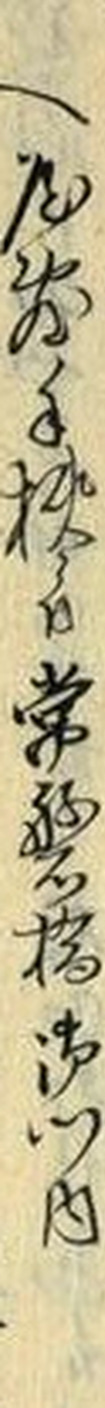屋敷手狭ニ付常盤橋御門内御名
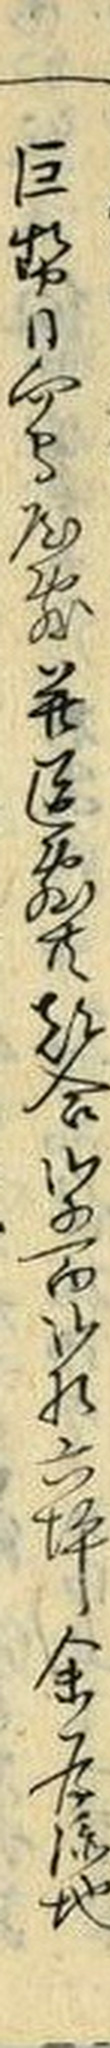巨勢日向守屋敷并道敷共都合弐千百弐拾六坪余為添地
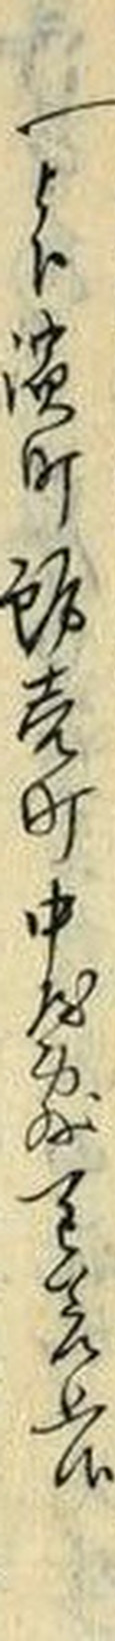被下浜町蛎売町中屋敷可被差上候
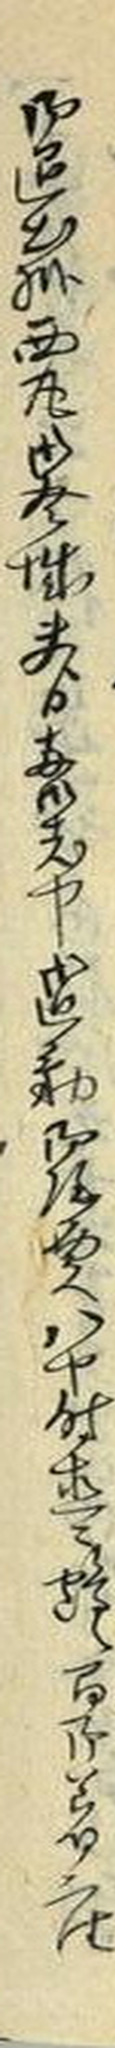御退出掛西丸御登城夫ゟ両御老中御廻勤御帰殿八半時直ニ鶴之間御着座
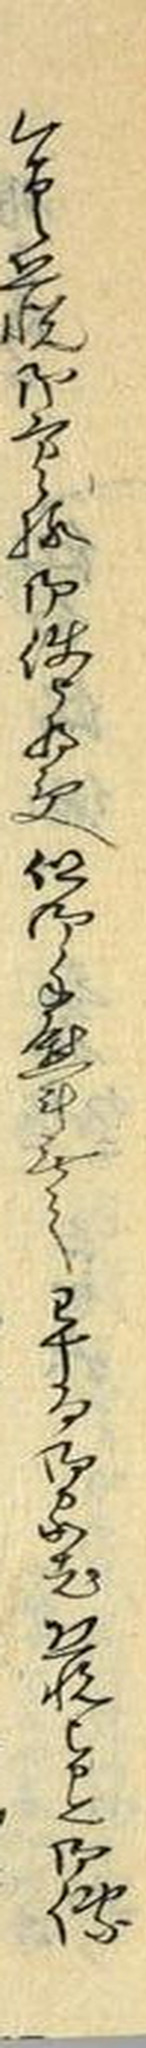今日之恐悦御方々様御使被為受但御手熨斗無之畢而御家老恐悦被申上御傅
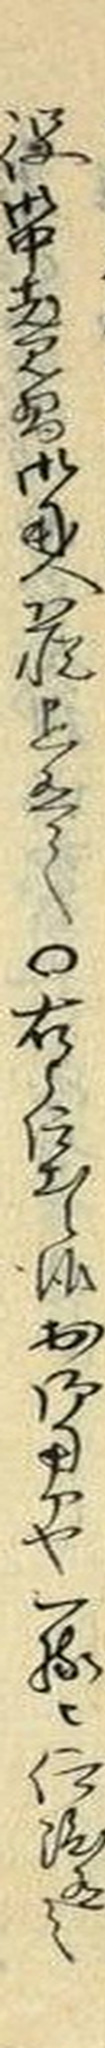役御中老見習御用人恐悦申上有之〇右被仰出候趣於御用部や一統被仰渡有之
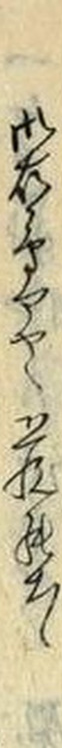御右筆部やへ恐悦罷出候
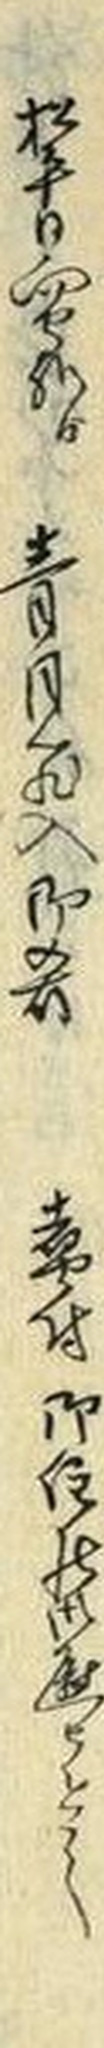松平日向守様ゟ青目籠入御肴煮付御住居御慰被進之
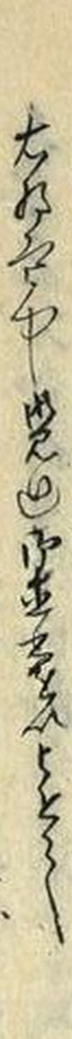右為寒中御見廻御直書を以被進之
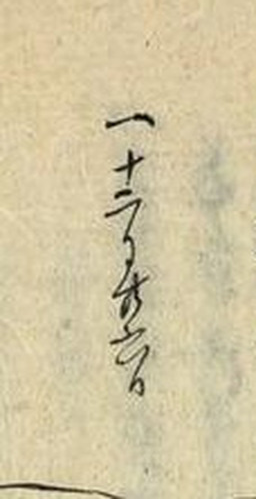一十二月廿五日
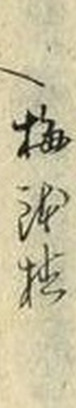梅鉢植
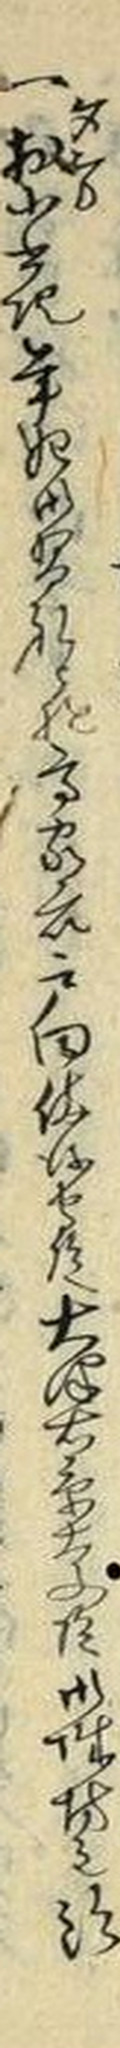一夕方於小書院年始御習礼被遊高家衆戸田備後守殿大沢右京太夫殿御城坊主鈴
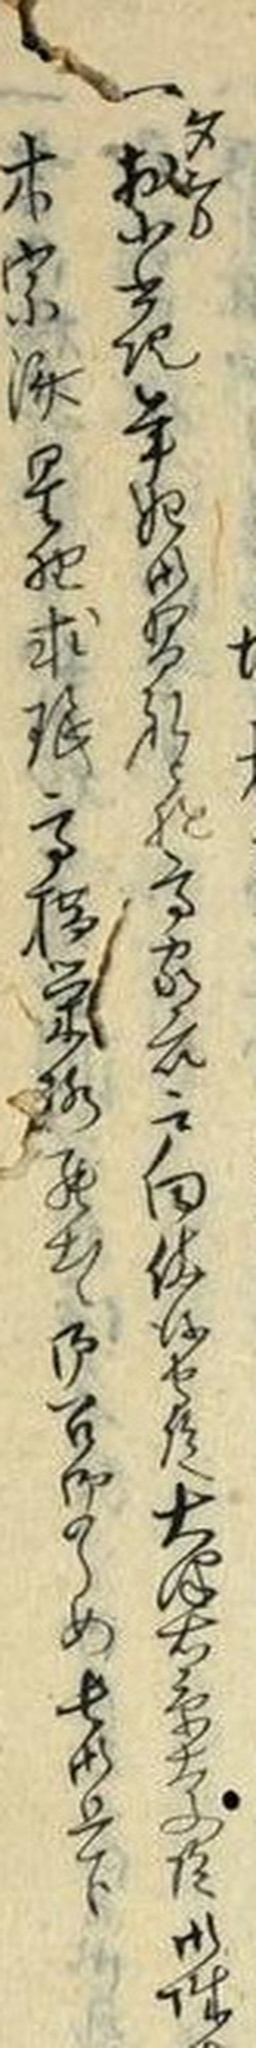木宗済星野求珉高橋栄格罷出候御召御のしめ長上下

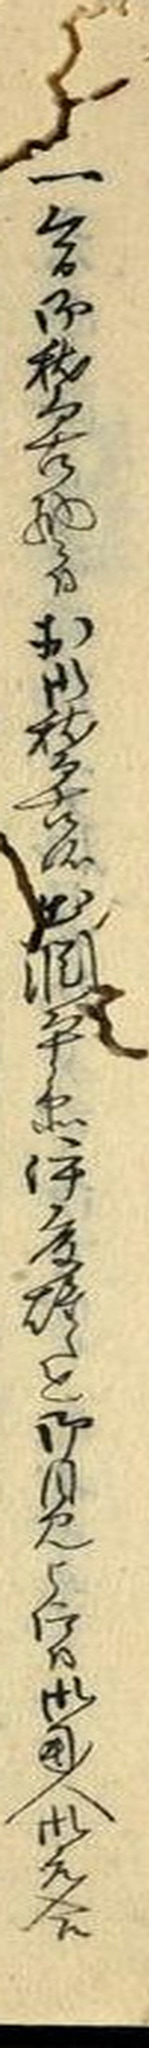一今日御稽古納ニ付於御稽古所出淵平兵衛伊藤雄之進御目見被仰付御用人御取合
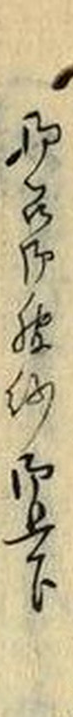御召御服紗御上下
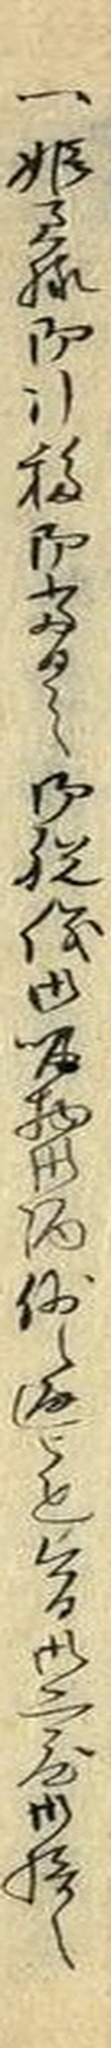一姫君様御引移御当日之御祝儀御吸物御酒例之通被進今日御二度御膳之
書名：少傅日録抄（斉承付側向頭取日記、在府）
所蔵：福井県文書館 Fukui Prefectural Archives
